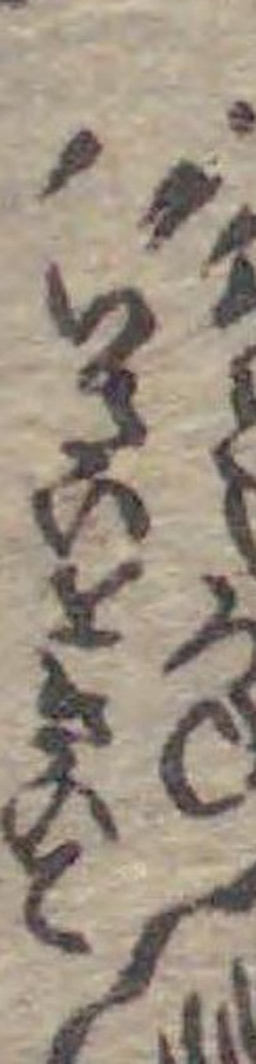いさいをきゝ入て
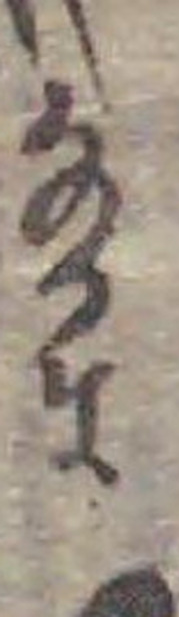なかま
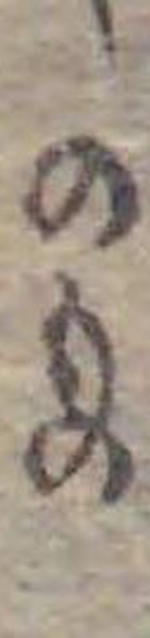のもの
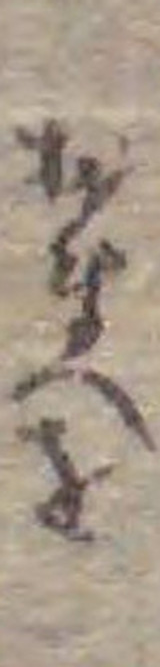おまへを
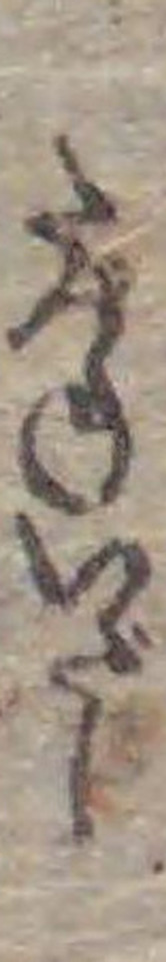たつねいだし
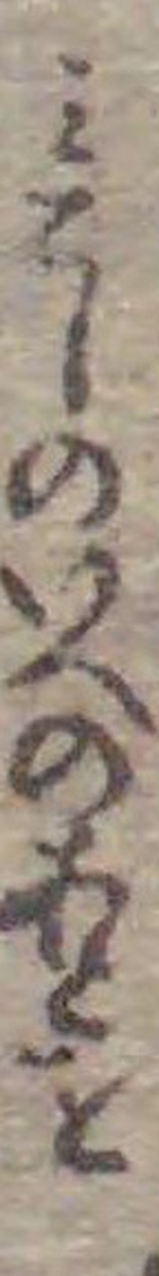みこしのいへのあとを
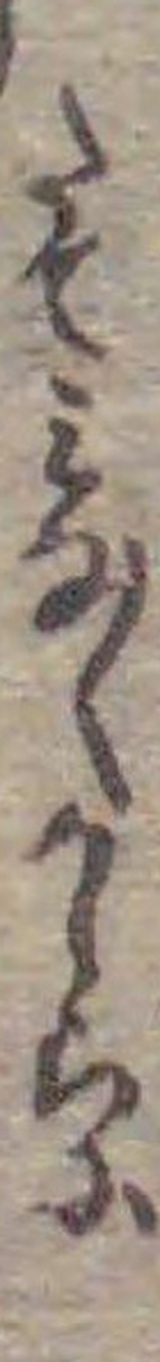たてみな〳〵かしらに
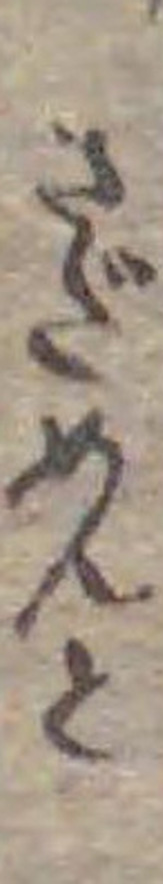さだめんと
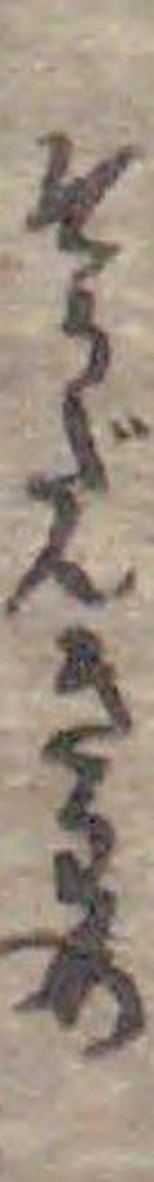そうだんきわめ
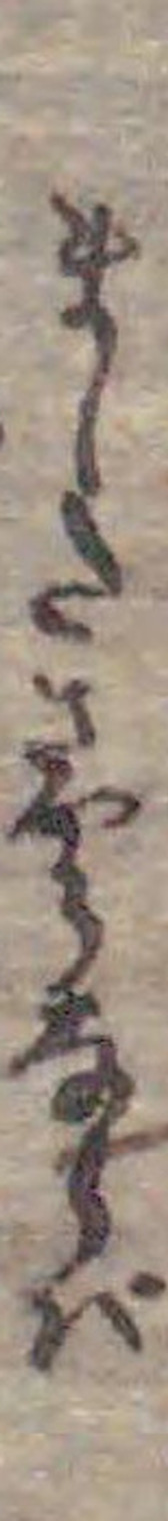ましたさやうならば
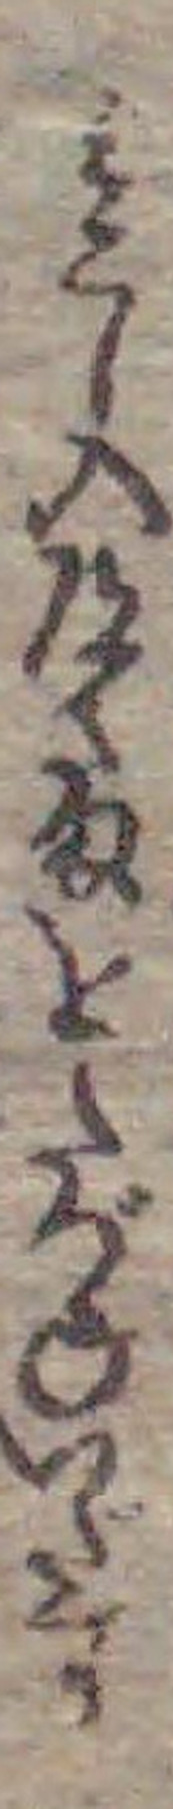みこし入道さまをたづねいだす
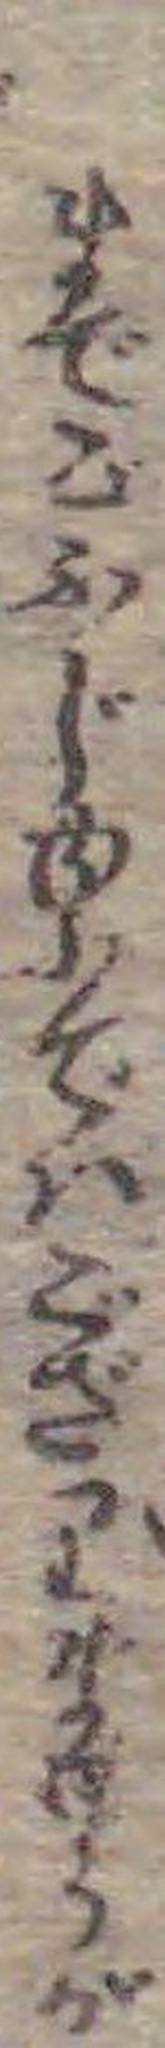までごふじゆにではござりませうが
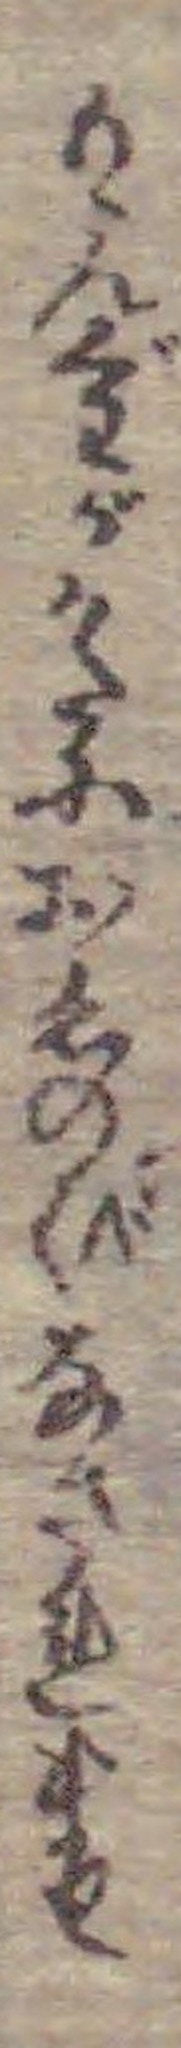もゝんぐわがかたにおしのびなされませ

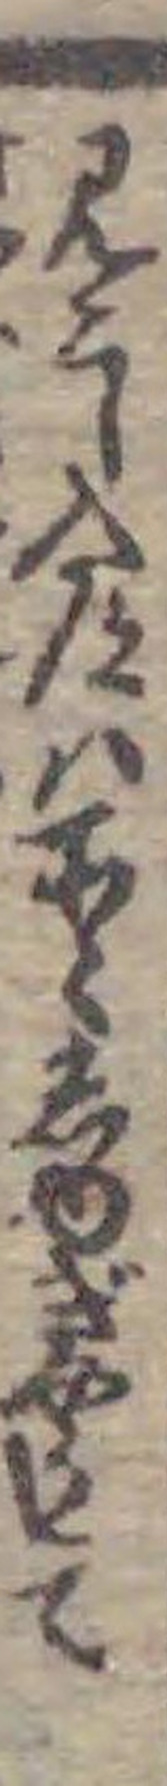見こし入道は品々しゆぎやうして
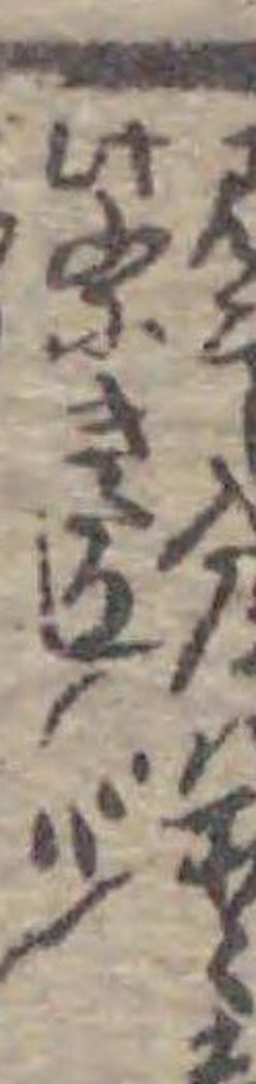此山にきたりし
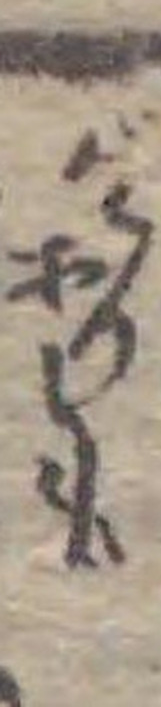がおりしも
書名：[化物一代記] : 5巻
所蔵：国立国会図書館 National Diet Library, JAPAN
